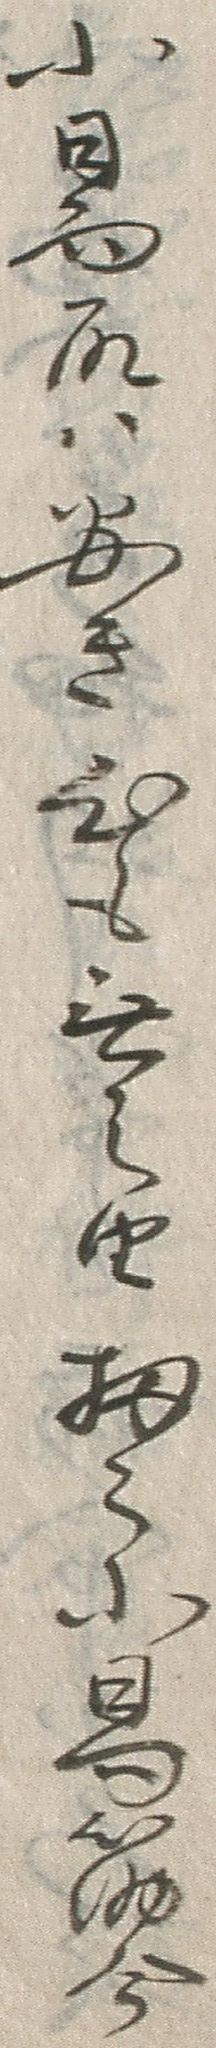小日向衆は安き心も無之由扨々小日向筋今
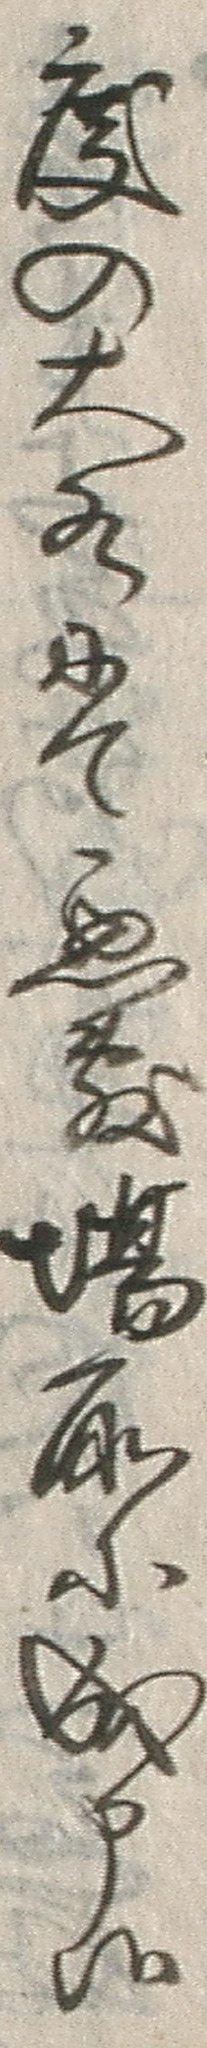度の大水にて悪敷場所に成申候
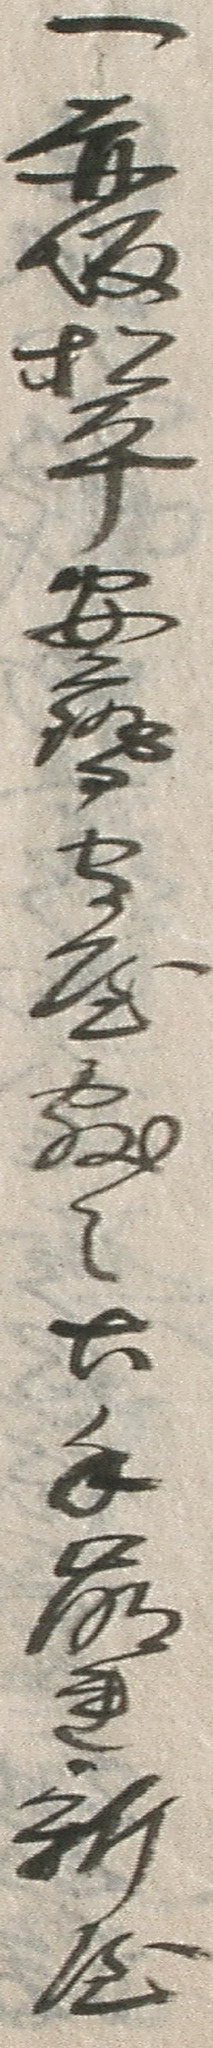一赤坂松平安芸守屋敷之土手崩れ新屋
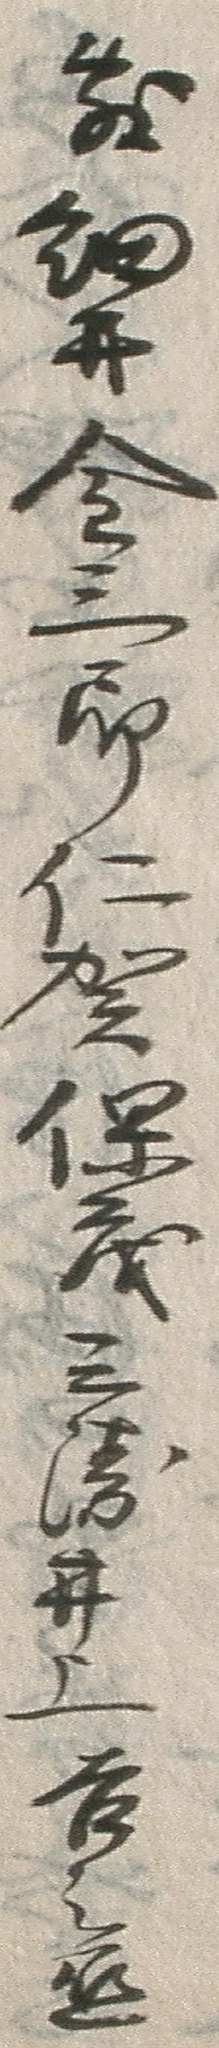敷細井金三郎仁賀保茂兵衛井上吉之丞
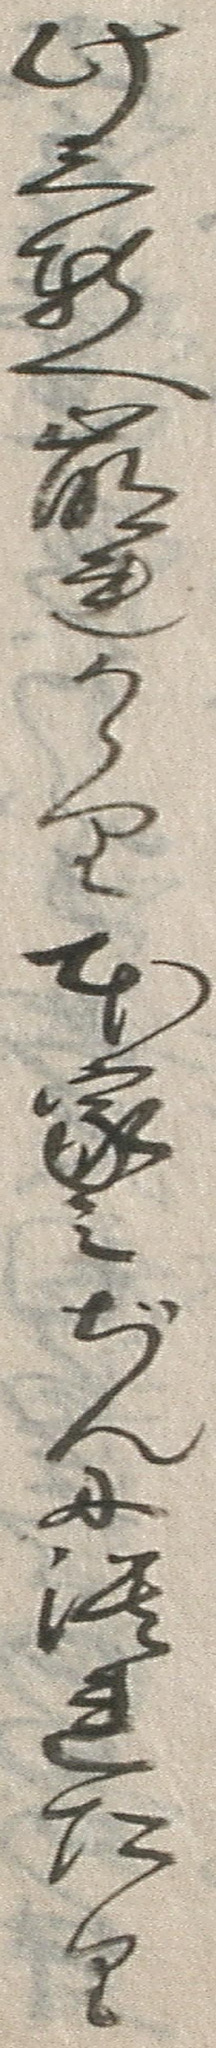此三軒へ崩れかゝり本家みぢんに潰れたり
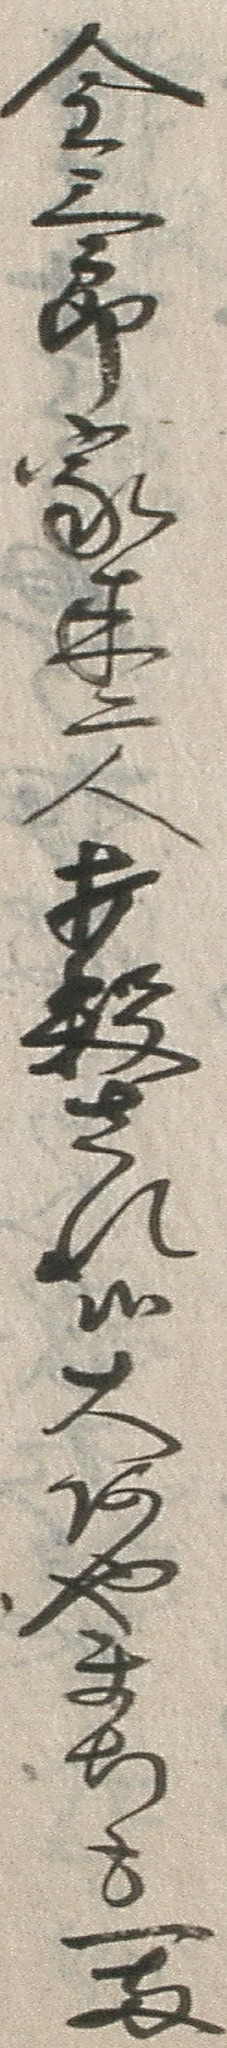金三郎家来二人打殺され候大あやまちも一両
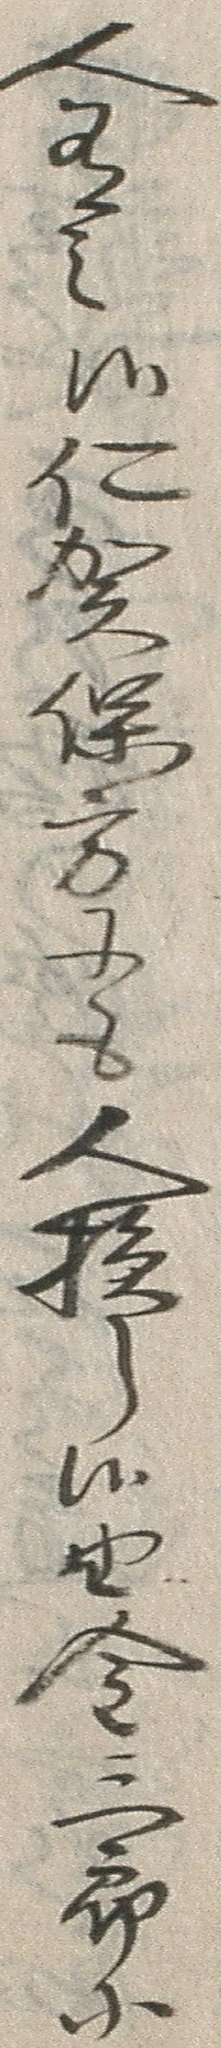人有之候仁賀保方にも人損し候由金三郎に
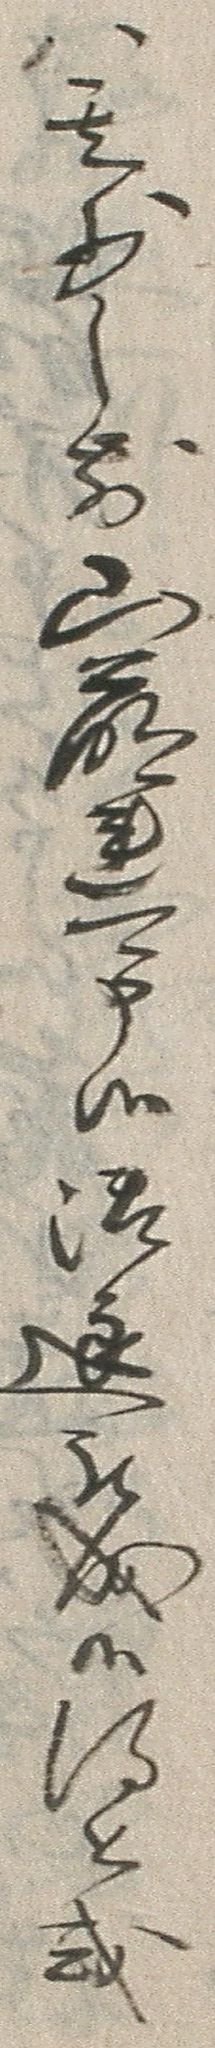は其少し前山崩れ可申候御逐被成候得と或
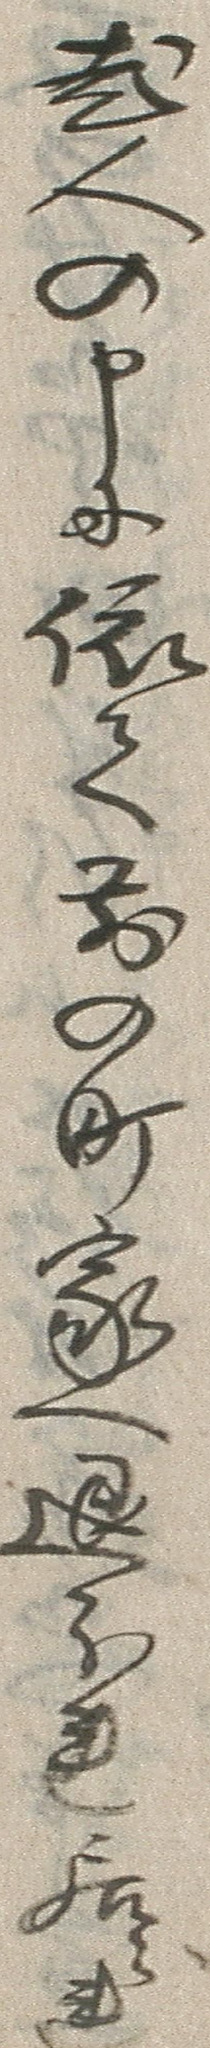老人の申に依て前の町家へ退かれ居られ
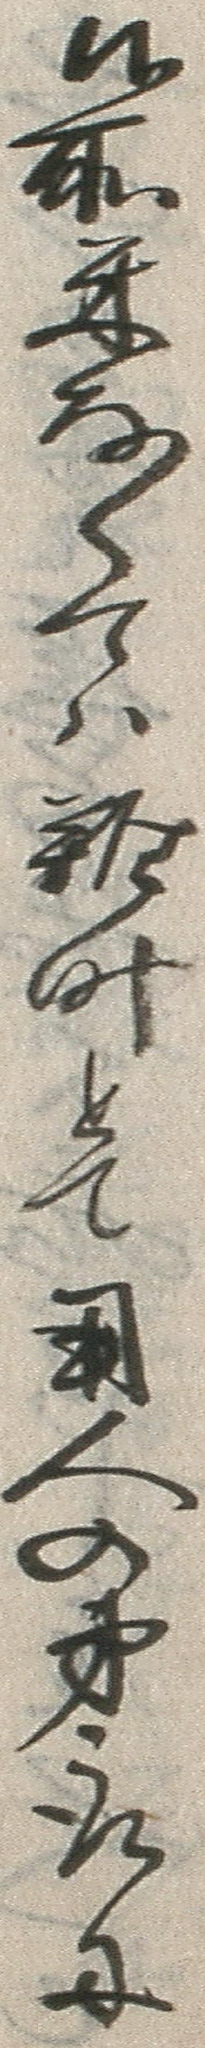候所米なくては難叶とて用人の弟取に
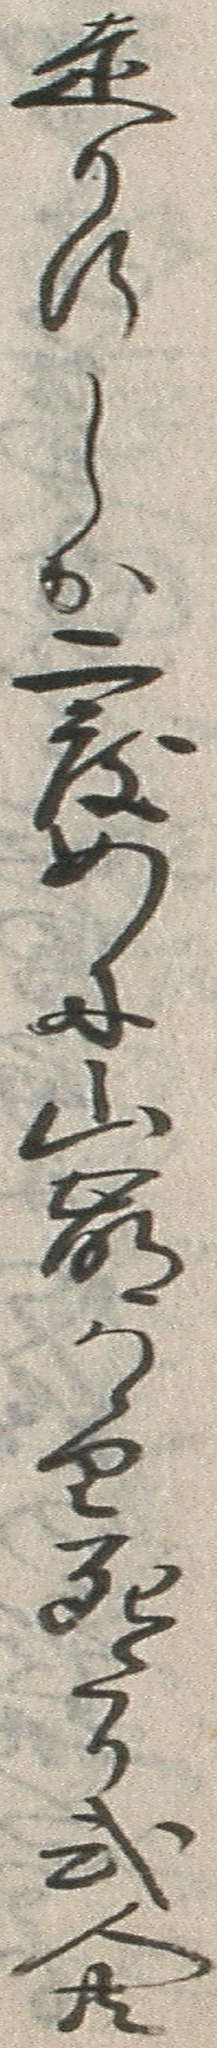走り行しか二度めに山崩けり死たり弐人共
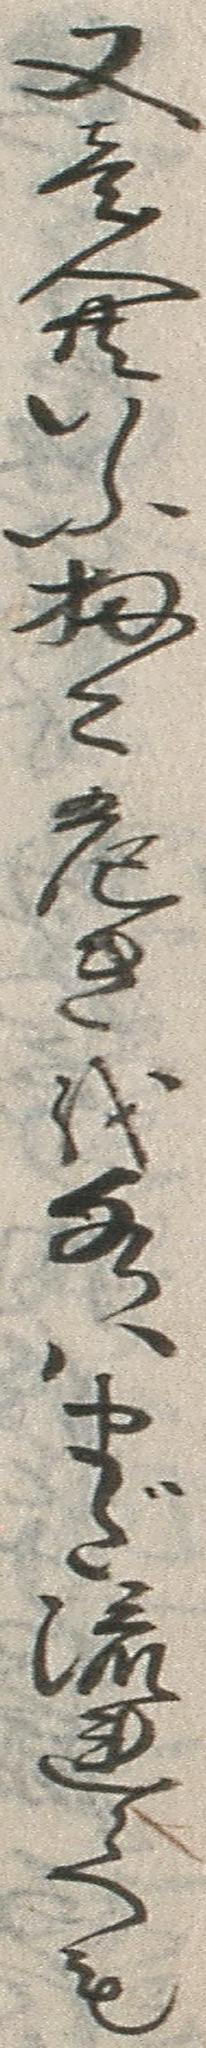又壱人共いふ扨々危き哉水はまだ流れても
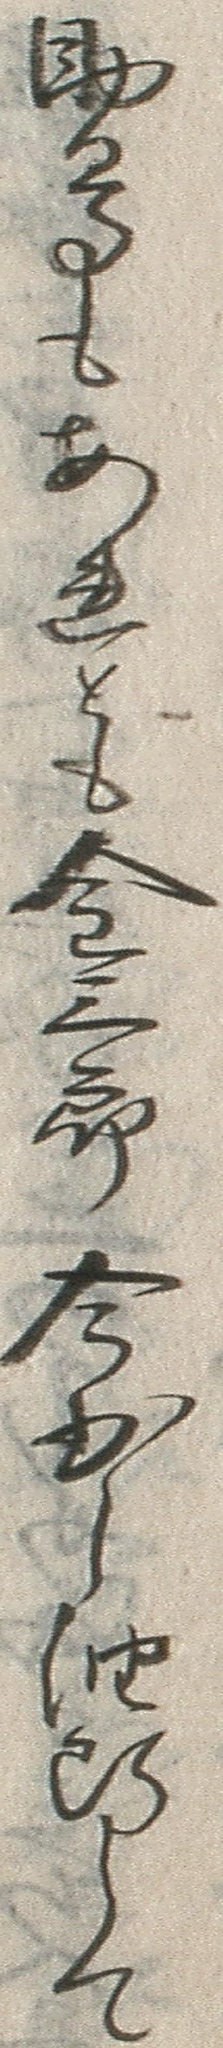助る事もあれとも金三郎今少し油断して
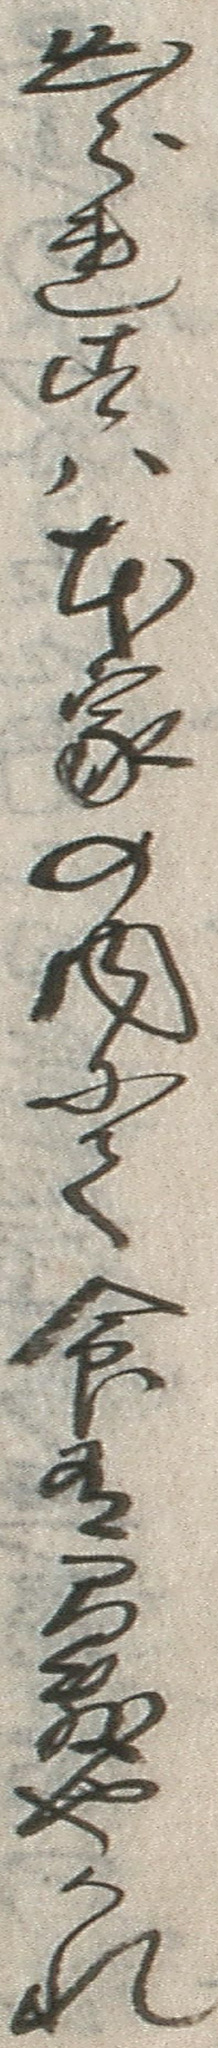出られすは本家の内にて命有間敷也かれ
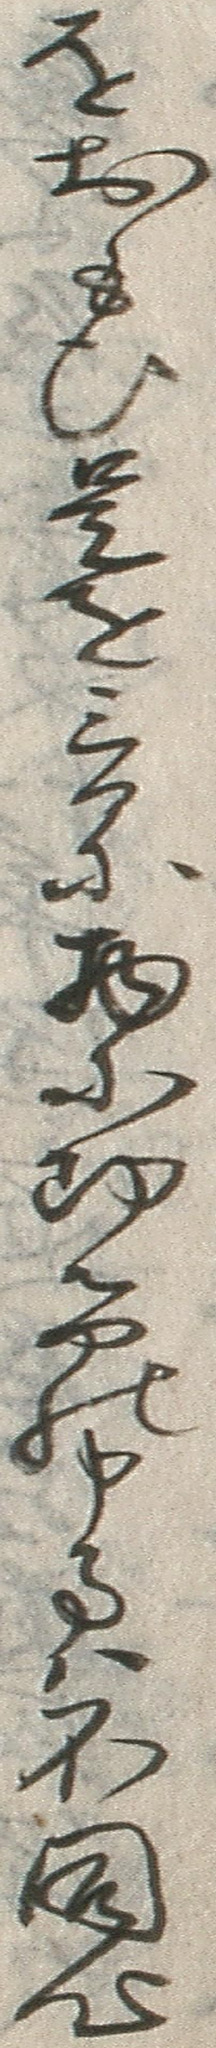をおもひ是をみるに物に即けの申事は不同心
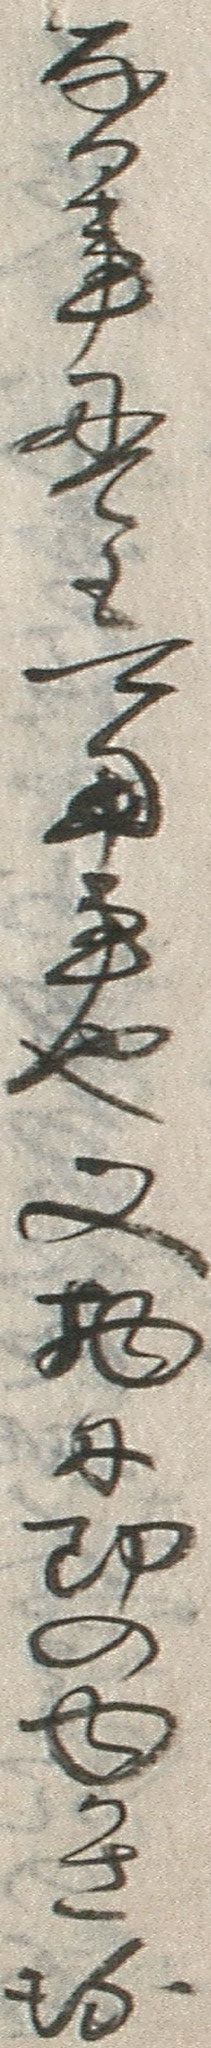なる事にても可用事也又物に即のゆかさる
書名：享保十三年江戸洪水記
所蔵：東京大学地震研究所図書室 Earthquake Research Institute Library, The University of Tokyo, JAPAN
